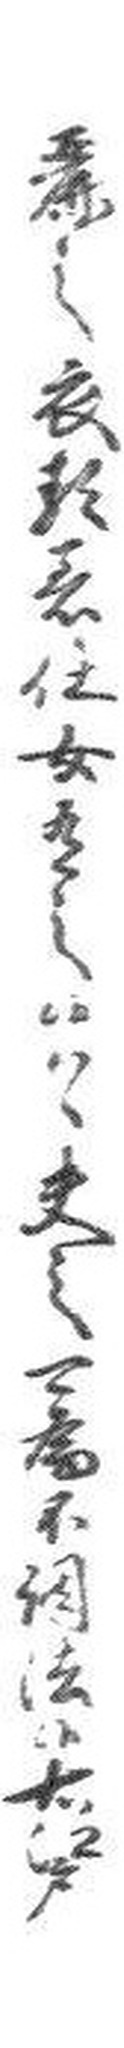麗之衣類着仕女有之候ハヽ夫之可為不調法候右江戸
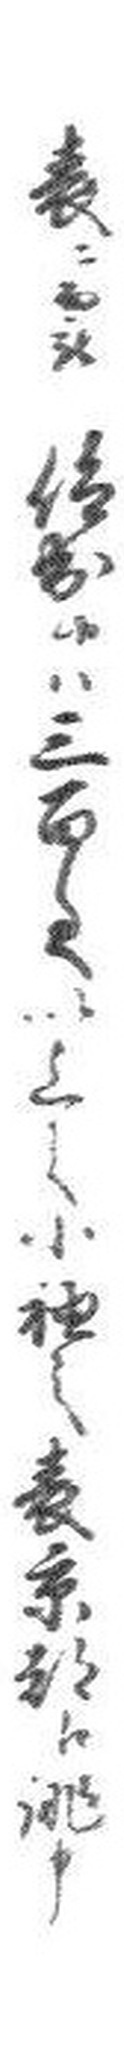表ニ而被仰出候ハ三百匁以上之小袖之表京都江誂申
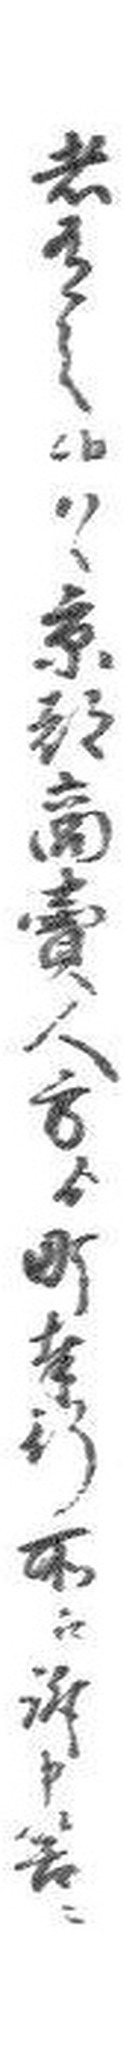者有之候ハヽ京都商売人方ゟ町奉行所江訴申筈ニ
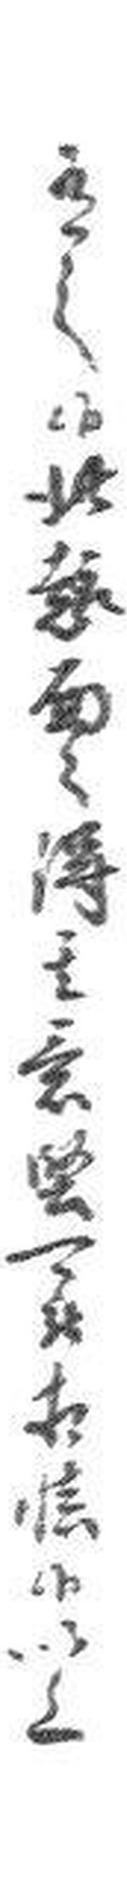有之候此趣面々得其意堅可被相慎候以上
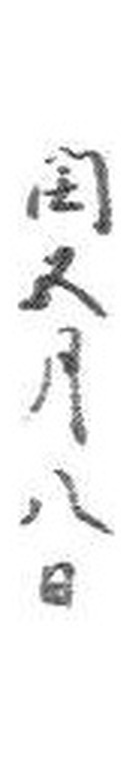閏五月八日

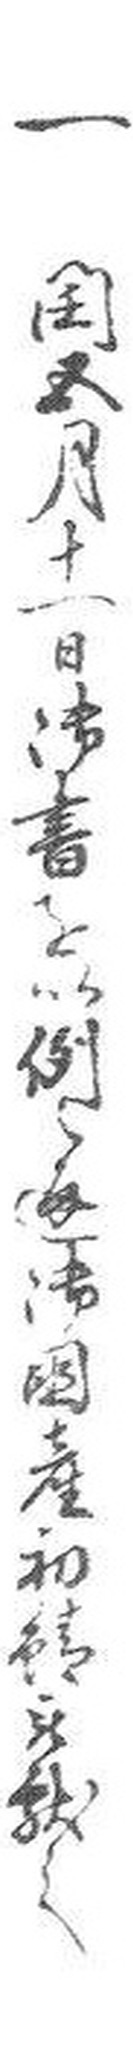一閏五月十一日御書を以例之通御国産初鯖被献之
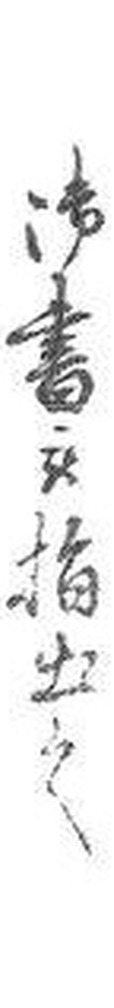御書被指出之
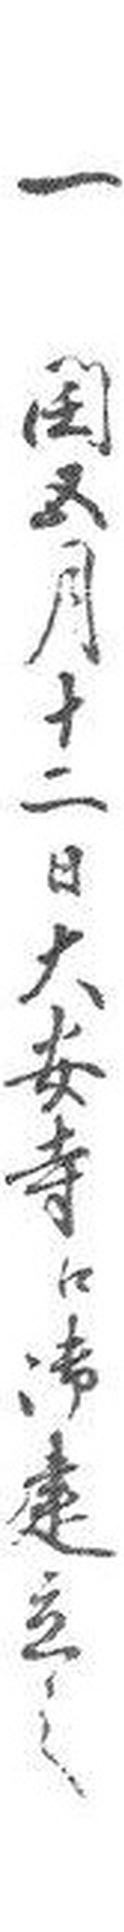一閏五月十二日大安寺江御建立之
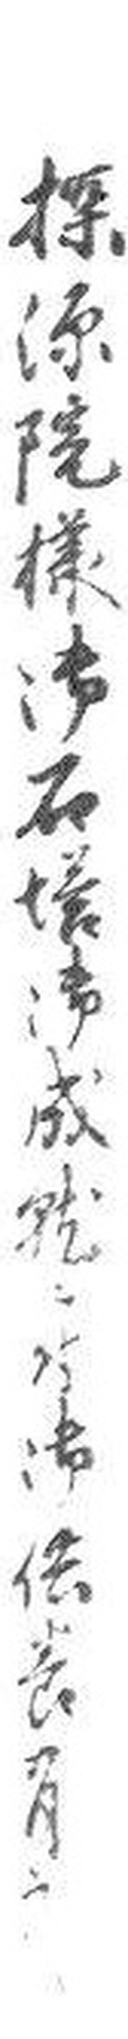探源院様御石塔御成就ニ付御供養有之
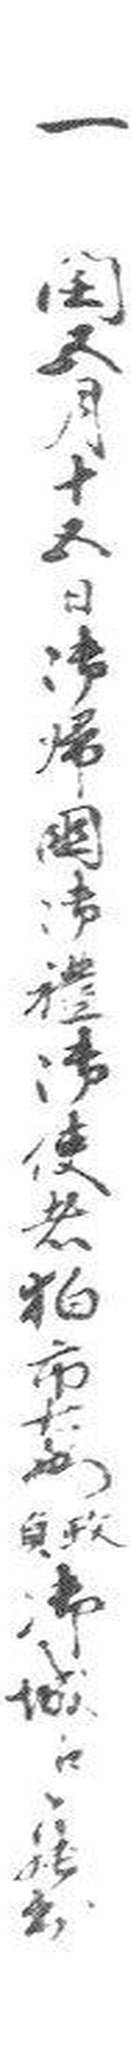一閏五月十五日御帰国御礼使者狛市右衛門政貞御城江罷出
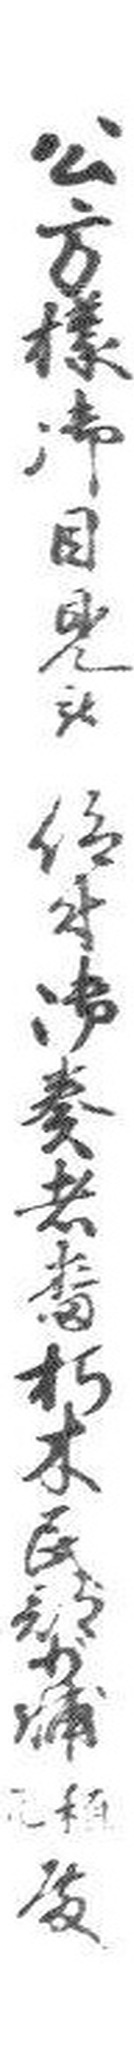公方様御目見被仰付御奏者番朽木民部少輔植元殿
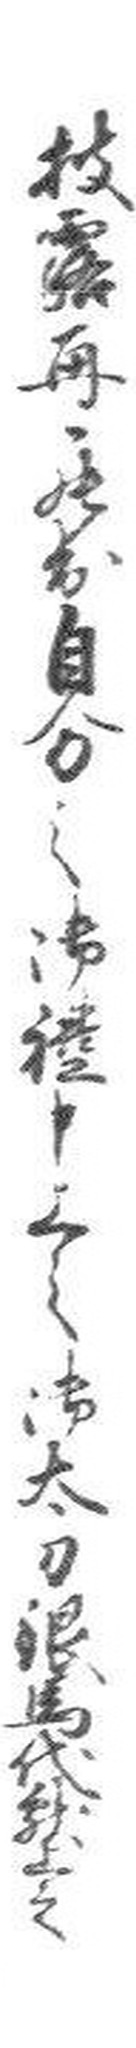披露再罷出自分之御礼申上之御太刀銀馬代献上之
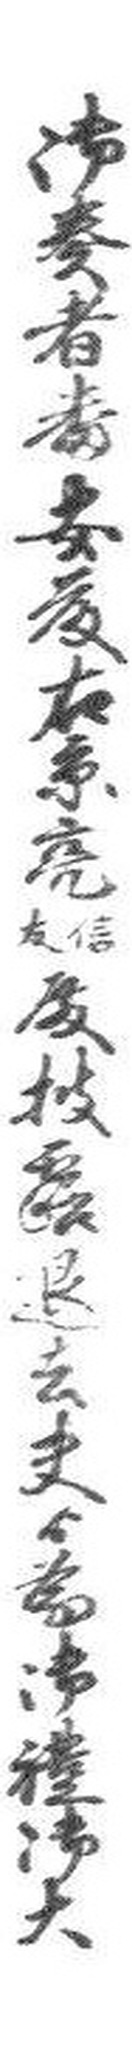御奏者番安藤右京亮信友殿披露退去夫ゟ為御礼御大
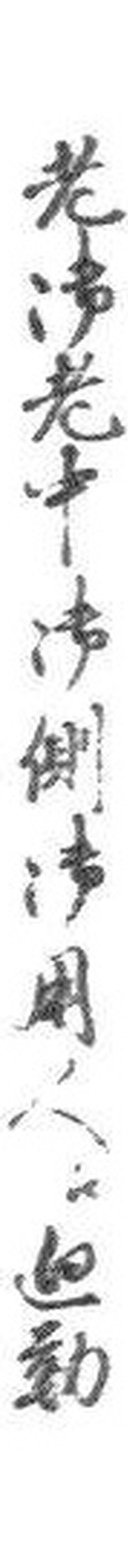老御老中御側御用人江廻勤
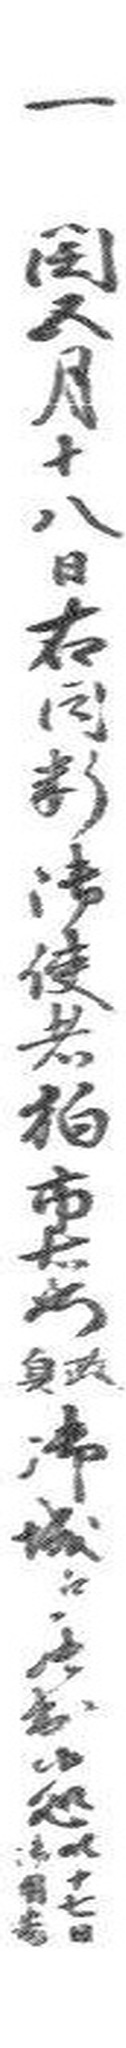一閏五月十八日右同断御使者狛市右衛門政貞御城江罷出候処
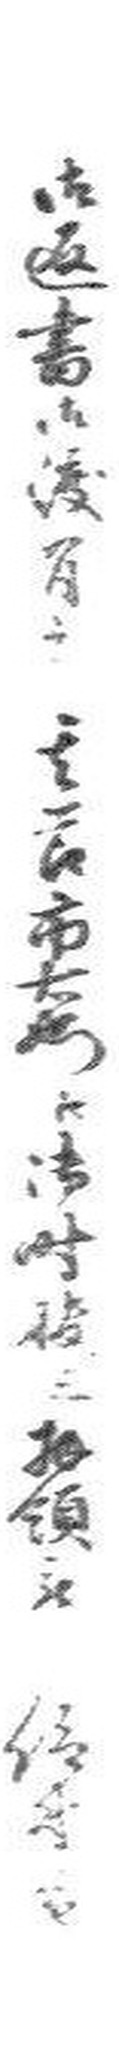御返書御渡有之其節市右衛門江御時服三拝領被仰付旨
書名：家譜 二十九 吉邦公 従正徳二年到正徳三年
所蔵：福井県文書館 Fukui Prefectural Archives
